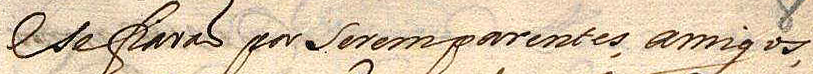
e se fiaraõ por serem parentes, amigos
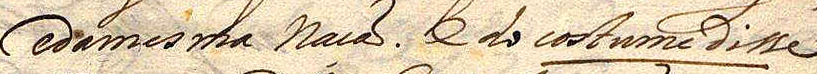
e da mesma Naçaõ. E do costume disse
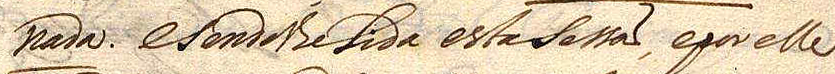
nada. E sendo lhe lida esta Sessão, e por elle
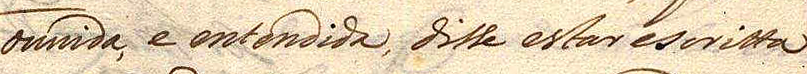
ouvida, e entendida, disse estar escritta
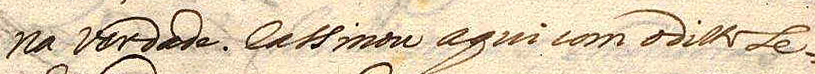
na verdade. E assinou aqui com o ditto Se
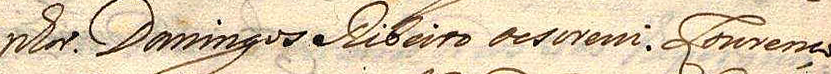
nhor. Domingos Ribeiro o escrevi: Lourenço
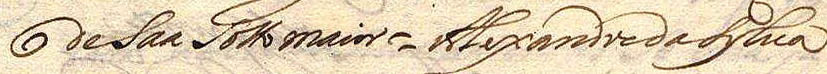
de Saa Sottomaior, Alexandre da Sylva
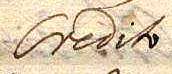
Credito
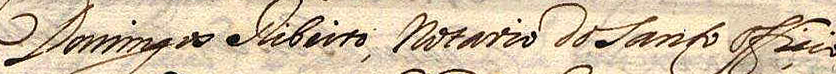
Domingos Ribeiro,Notario do Santo Officio
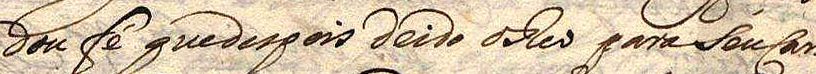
dou fé que despois de ido o Reo para Seu Car
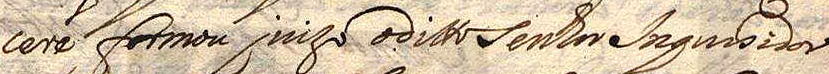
cere formou juizo o ditto Senhor Inquisidor
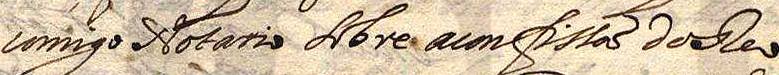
comigo Notario sobre a confissaõ do Reo
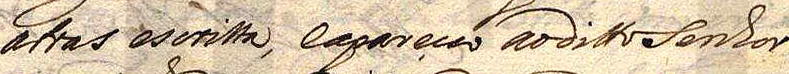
atras escritta, e apareceo ao ditto Senhor
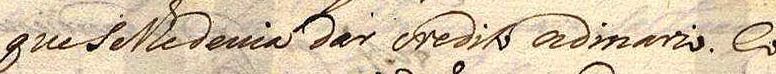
que se lhe devia dar credito ordinario. E
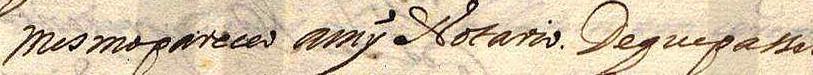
o mesmo pareceo a mȳ Notario. De que passei
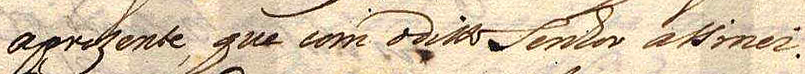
a prezente, que com o ditto Senhor assinei.
